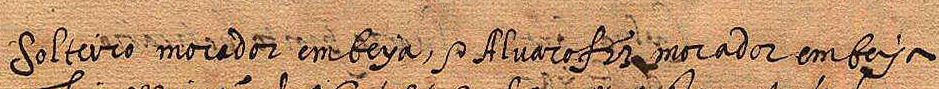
Solteiro morador em beya, e Aluaro frz̄ morador em beya
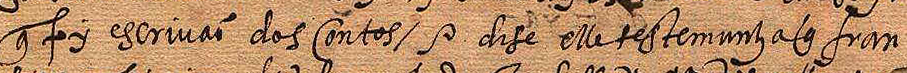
q̄ foy escriuaõ dos Contos / e dise elle testemunha q̄ fran
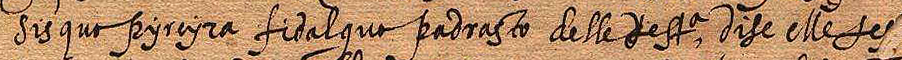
sisquo pyreyra fidalguo padrasto delle testa, dise elle tes
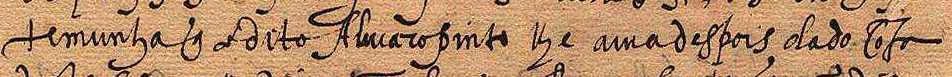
temunha q̄ o dito Aluaro pinto lhe auia despois dado Cōta
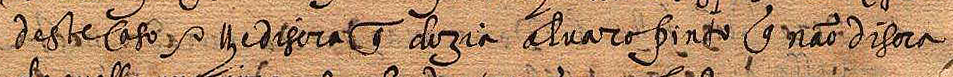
deste caso e lhe disera q̄ dizia aluaro pinto q̄ não disera
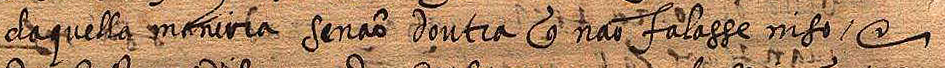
daquella maneira senaõ doutra q̅ naõ falasse niso / e
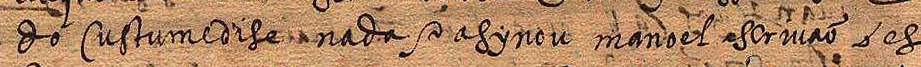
do Custume dise nada e asynou manoel escriuaõ o es
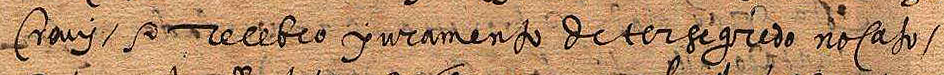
Creuy / e recebeo yuramento de ter segredo no Caso /
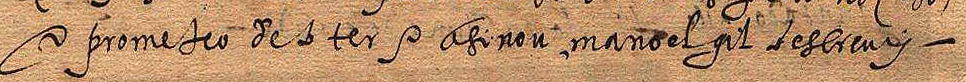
e prometeo de o ter e asinou, manoel gil o escreuy –
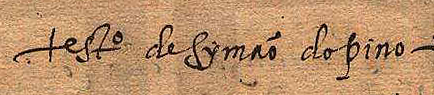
testo de Symaõ do pino –
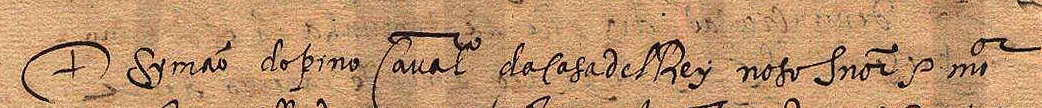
item Symaõ do pino Caualro da casa del Rey noso Snor̄ e mor
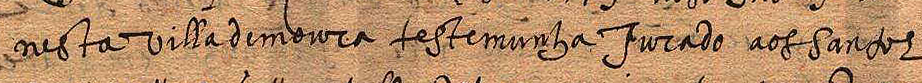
nesta villa de moura testemunha Jurado aos Santos
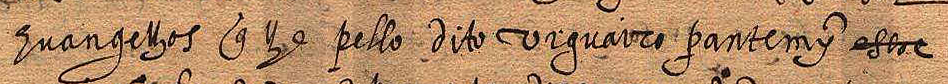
Euangelhos q̄ lhe pello dito viguairo ꝑante mȳ escre
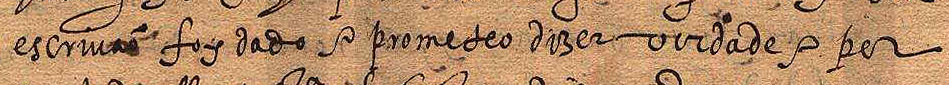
escriuaõ foy dado e prometeo dizer verdade e per
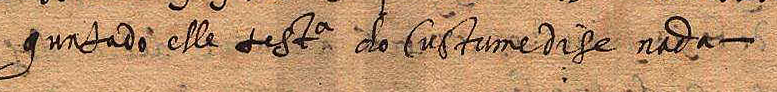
guntado elle testa do Custume dise nada –
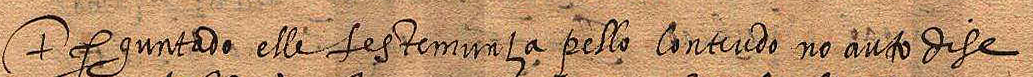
item ꝑguntado elle testemunha pello conteudo no auto dise
